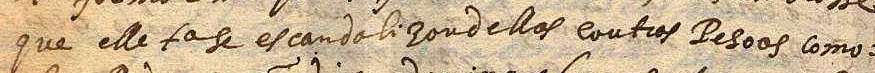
que elle ta se escandalizou dellas e outras Pesoas como
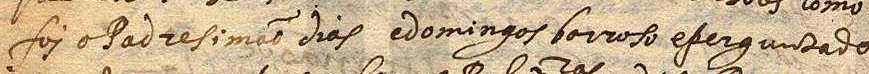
foj o Padre simaõ dias e domingos barroso e perguntado
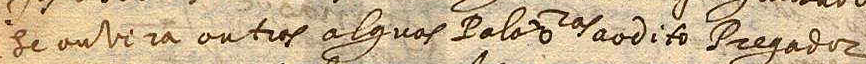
se ouvira outras alguas Palavras ao dito Pregador
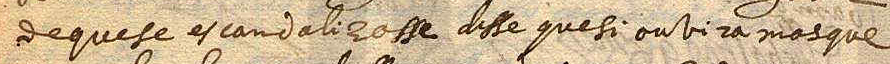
de que se escandalizasse disse que si ouvira mas que
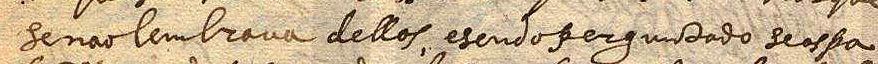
se nao lembraua dellas, e sendo perguntado se as pa
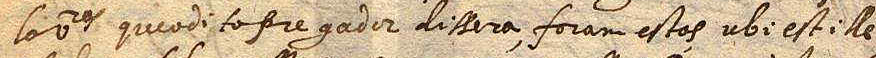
lavras que o dito pregador dissera, foram estas ubi est ille
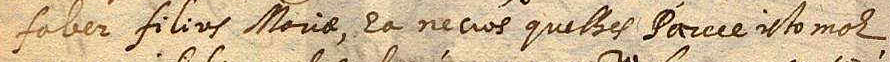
faber filius Mariæ, E a necios que lhes Parece isto mal
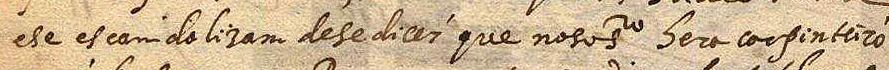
e se escamdalizam de se dicer que noso sro hera carpinteiro
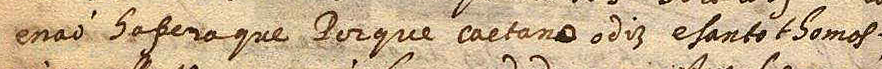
e naõ ha pera que Porque caetano o diz e santo thomas
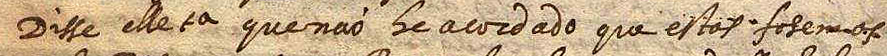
Disse elle ta que naõ he acordado que estas fosem os
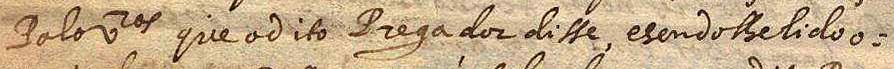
Palavras que o dito Pregador disse, e sendolhe lido o
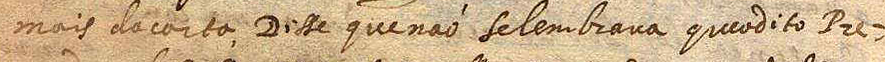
mais da carta Disse que naõ se lembraua que o dito Pre
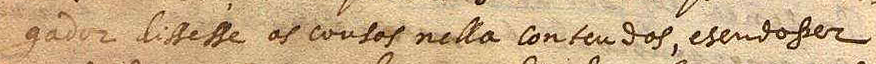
gador dissesse as cousas nella conteudas, e sendo per
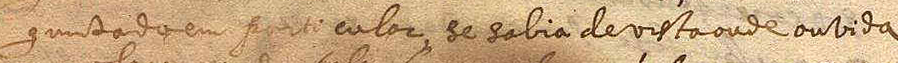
guntado em particular, se sabia de vista onde ouvida
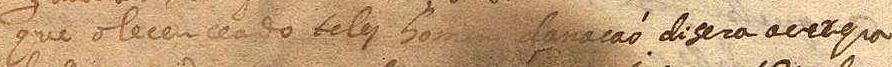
que o lecenceado telez homem da naçaõ disera acerqua
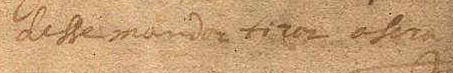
de sse mandar tirar a sera
